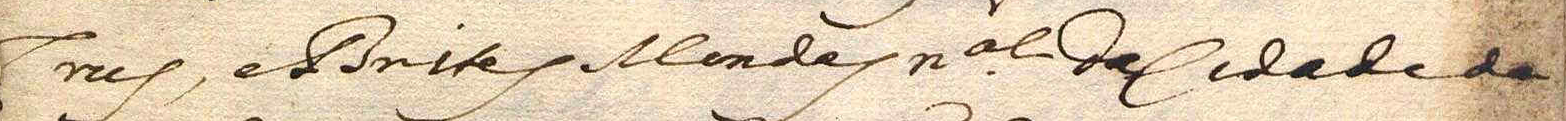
Crus, e Brites Mendes n.al da Cidade da
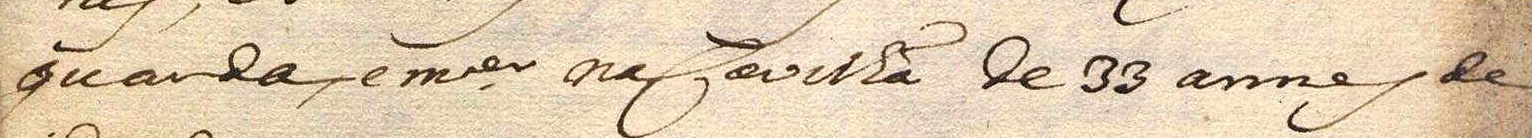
guarda, e m.or na Covilhã de 33 annos de
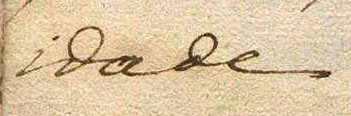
idade
